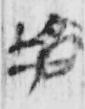塙
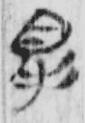{胃刀}（謂）
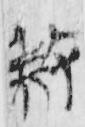殺
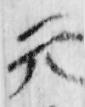亓（其）
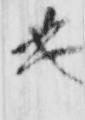弟
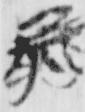○（嬴）
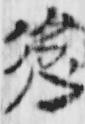○（路）
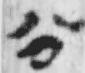公
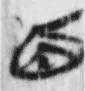角
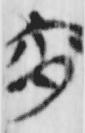宵
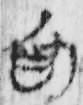爲
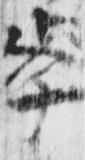李
